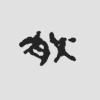歲
